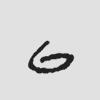㠯（以）
